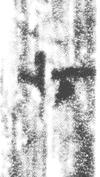才
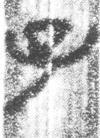子
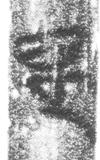是
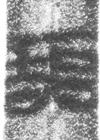○（聞）
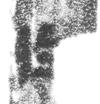於
